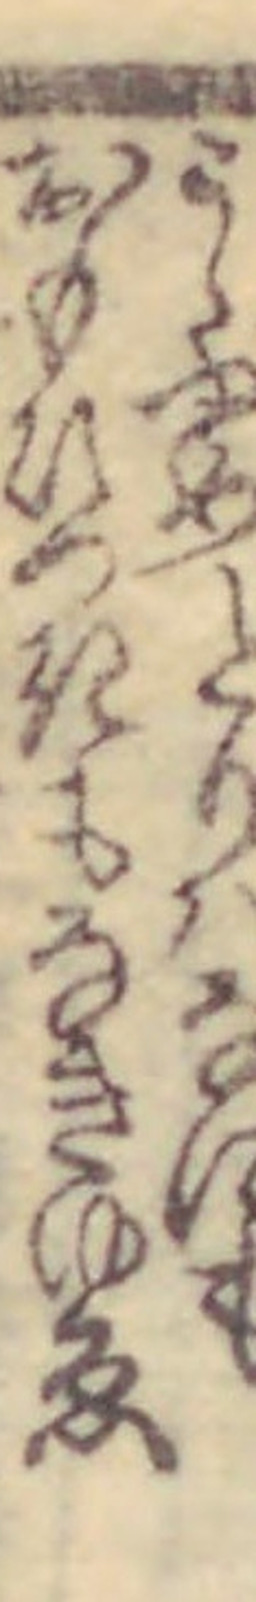おもひつきもなきゆゑ
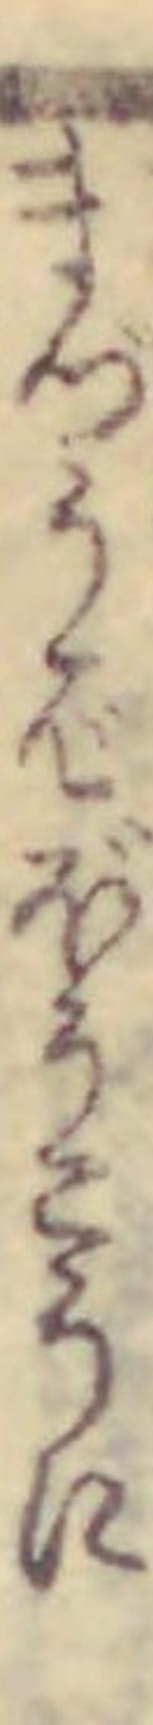まづうばぼうこうに
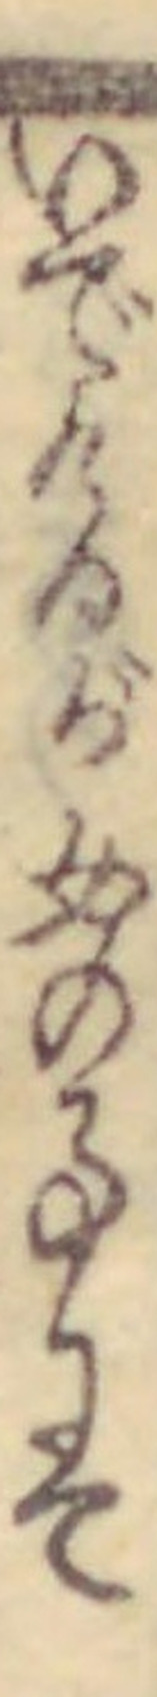いでけるが女の事にて
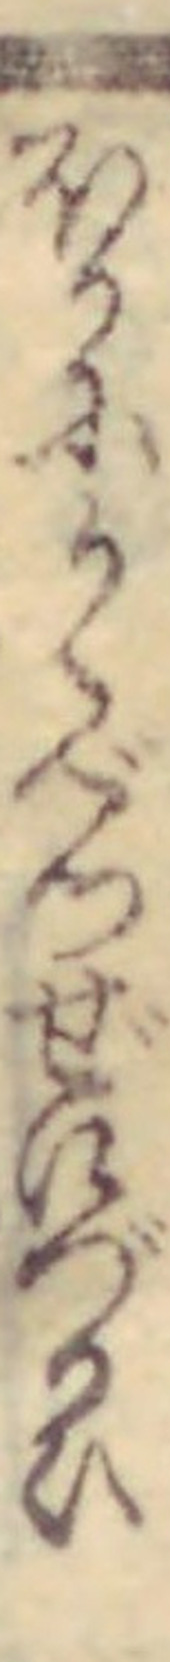ほかにかくべつぜにづかひ
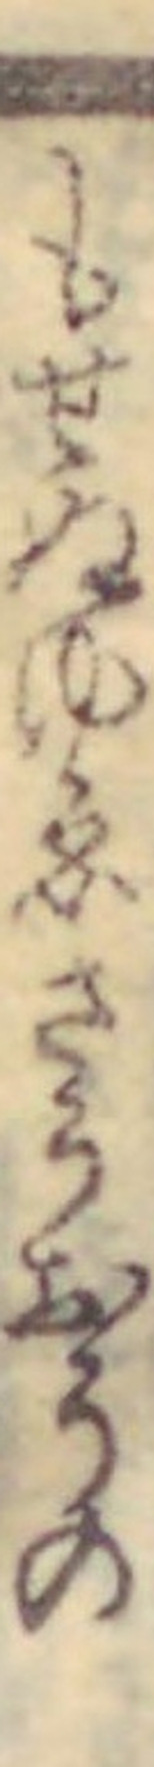もせぬゆゑさうおうの
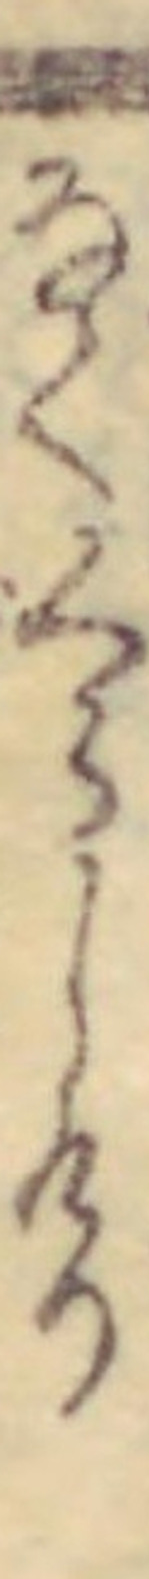なくくらしけり
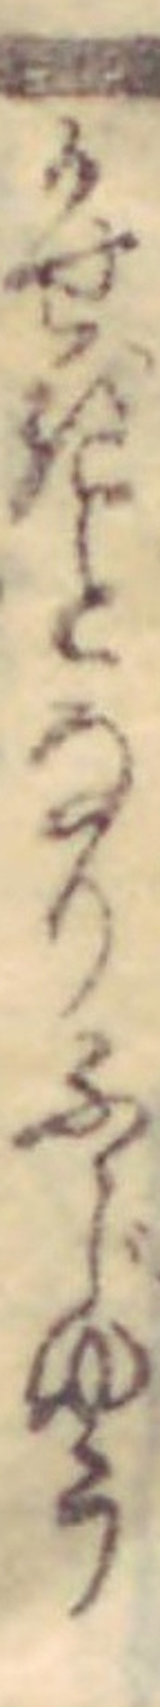かせぎとなりふじゆう
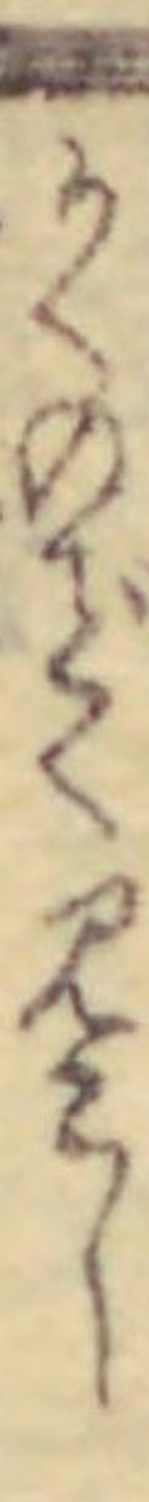かくのごとくみこし
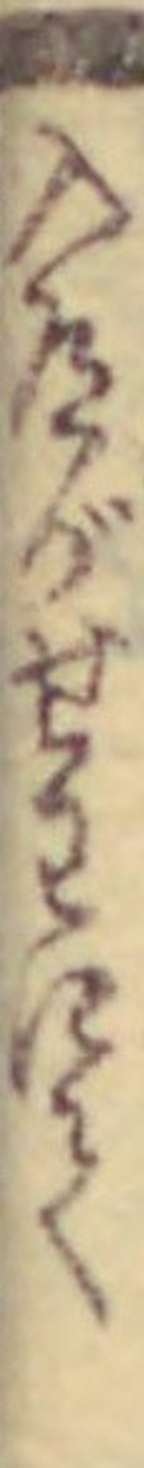入道がせわにて
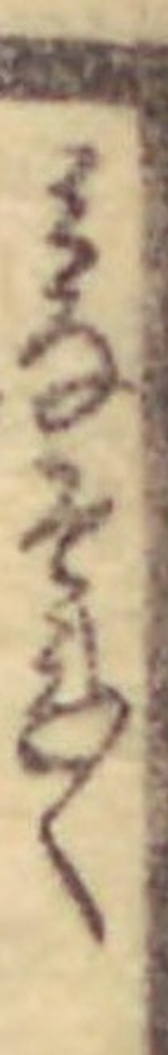みなそれ〳〵
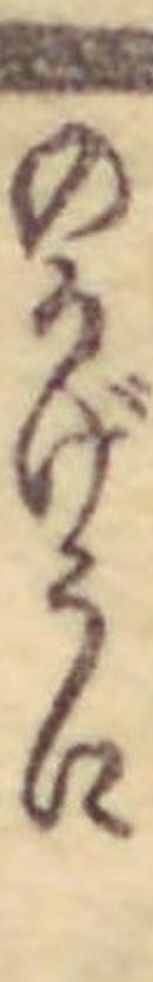のかげうに
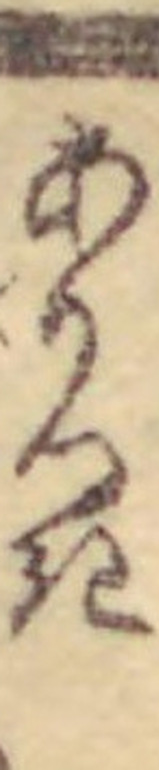ありつき
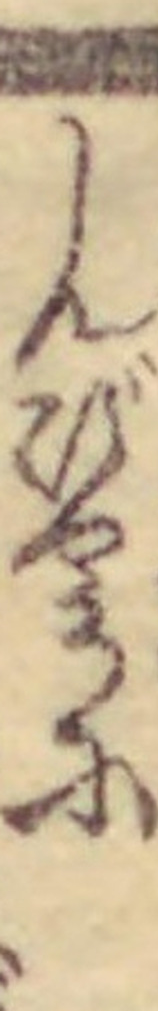しんびやうに
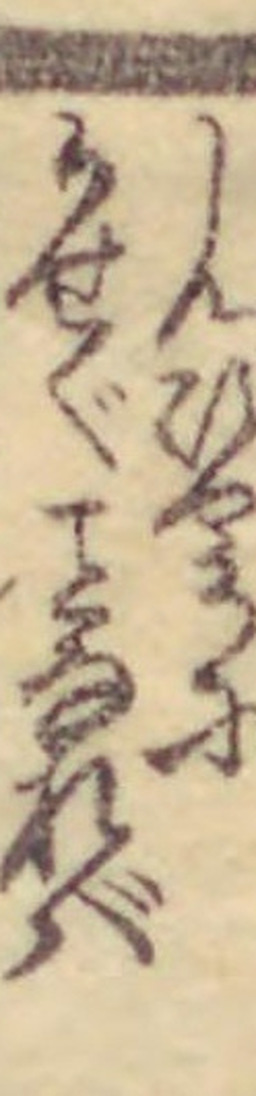かせぐことなれば
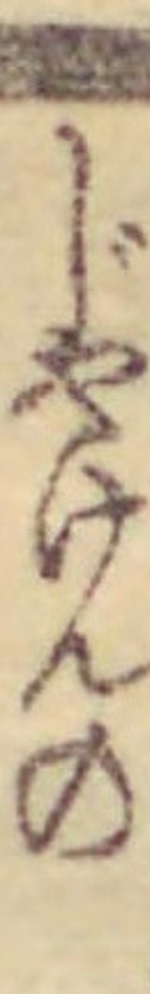じやけんの
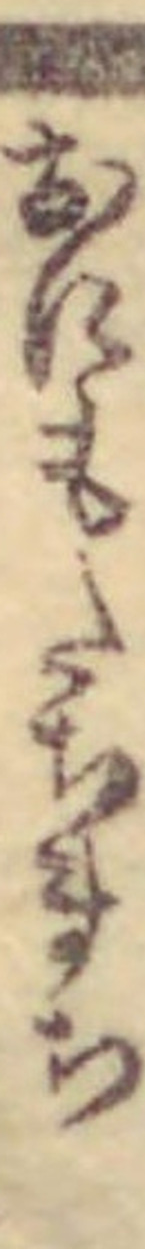おにもたちまち
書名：化物世帯氣質
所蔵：国立国会図書館 National Diet Library, JAPAN
